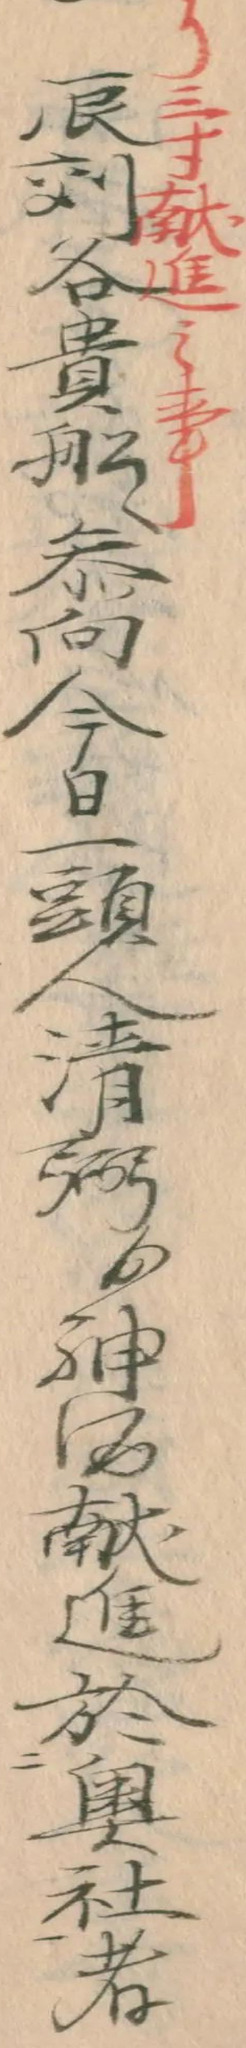一辰刻各貴舩へ参向今日一頭人清弼ゟ神酒献進於奥社者
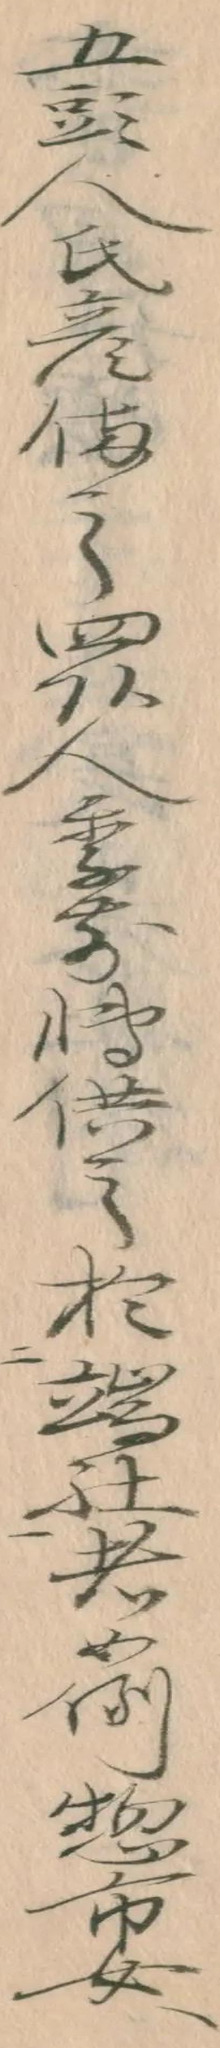五頭人氏彦備之四頭人季前轉供之於端社者如例惣市女ヘ
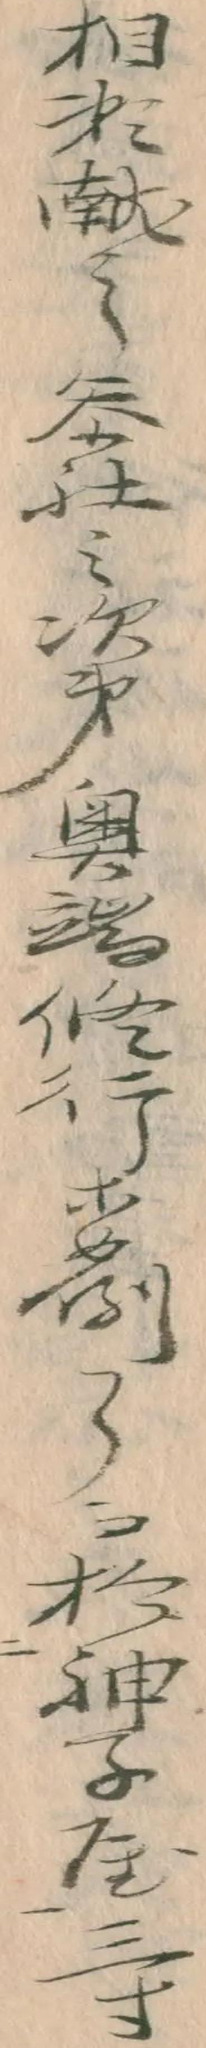相頼献之参社之次第奥端修行等如例了而於神子屋三寸
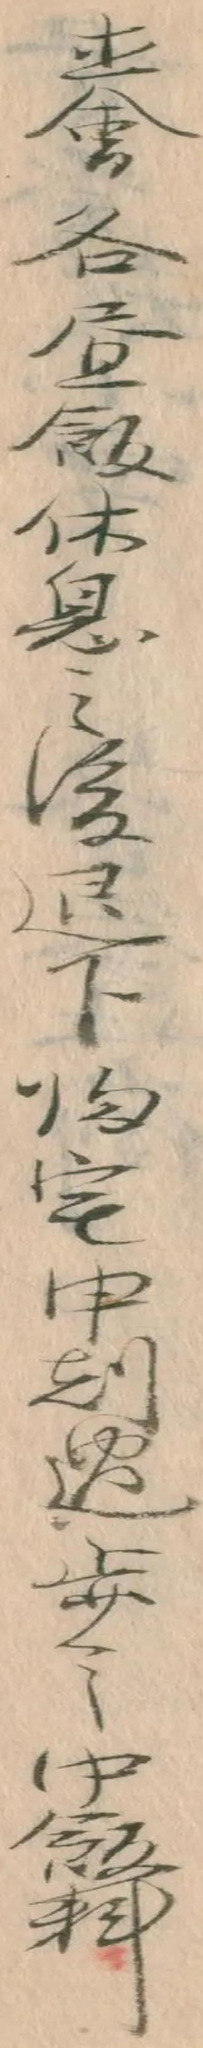直會各昼飯休息之後退下帰宅申刻過歩之中飯料
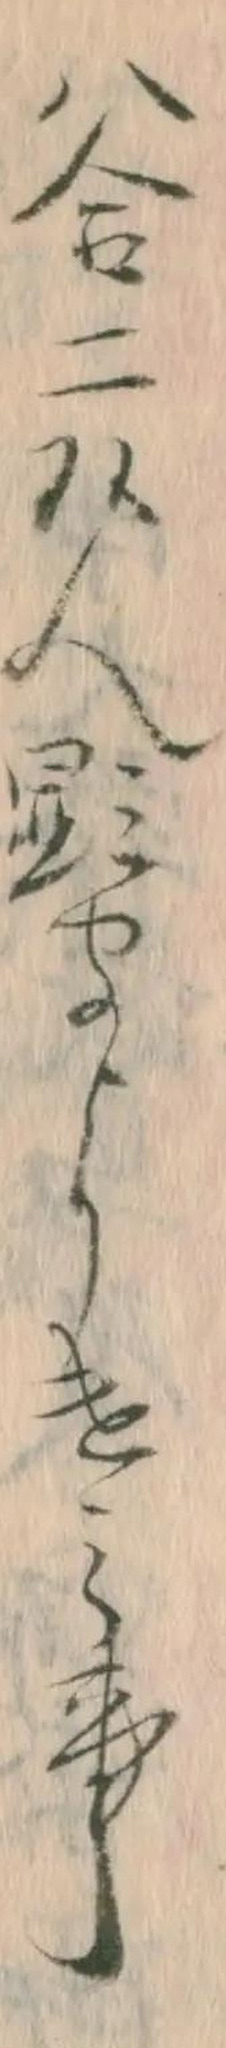八合二頭人顕守より遣之事
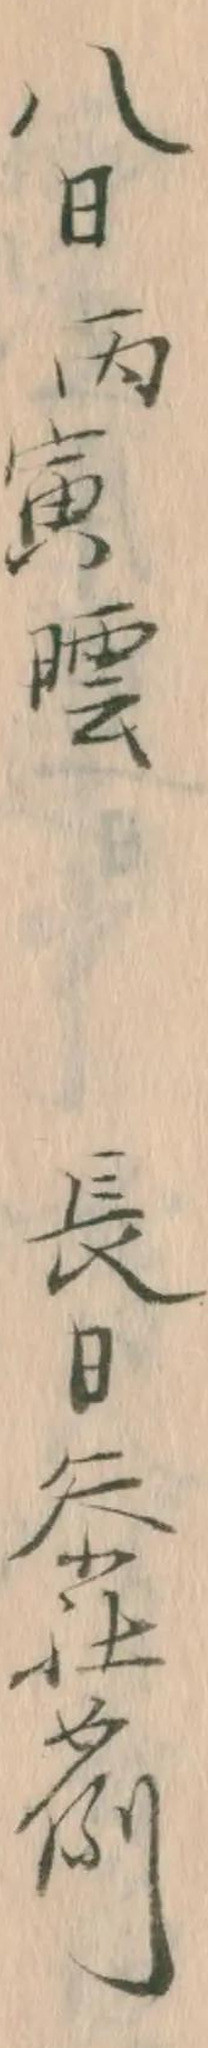八日丙寅曇長日参社如例
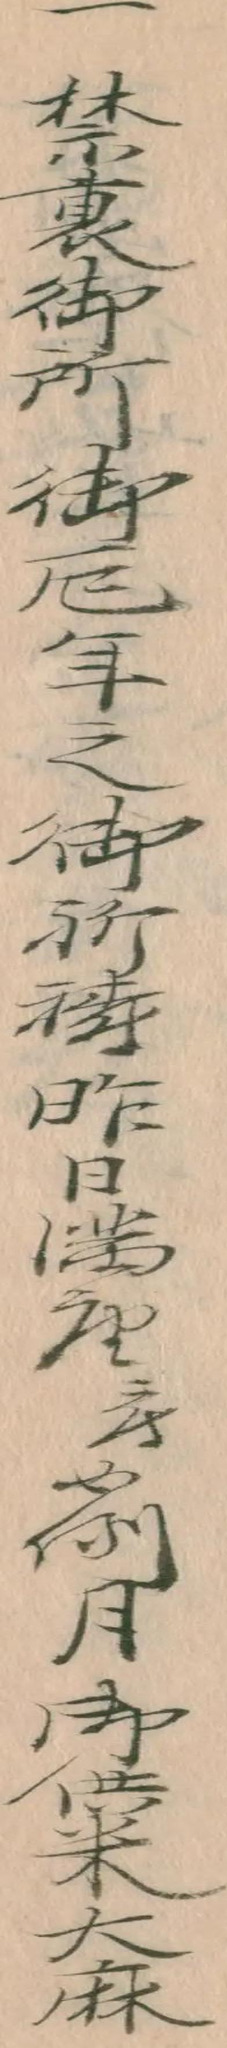一禁裏御所御厄年之御祈祷昨日満座ニ付御例月御供米大麻
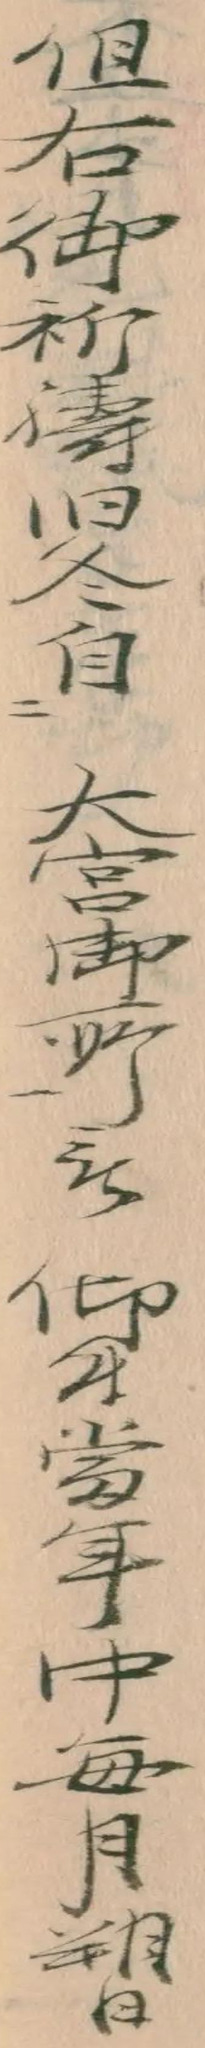但右御祈祷旧冬自大宮御所被仰付當年中毎月朔日
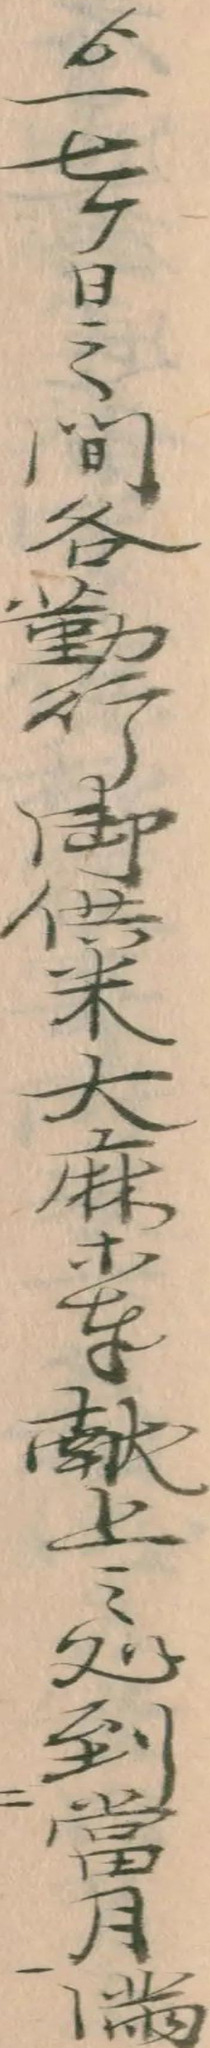ゟ一七ヶ日之間各勤行御供米大麻等奉献上之処到當月満
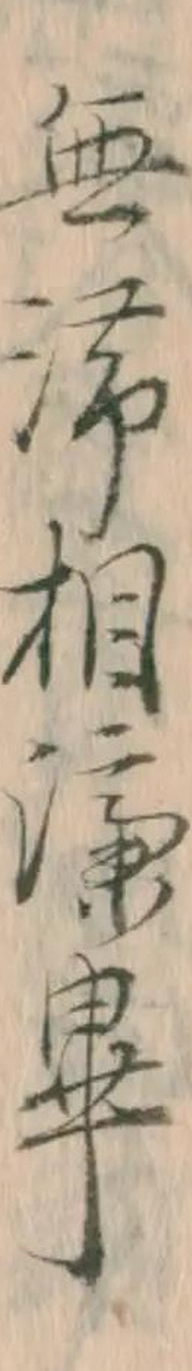無滞相済畢
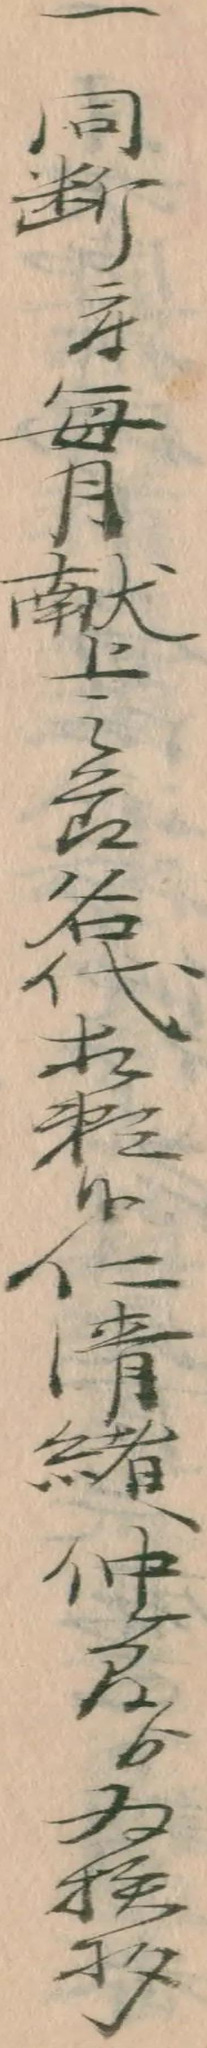一同断ニ付毎月献上之節名代相頼候仁清緒へ仲ケ間ゟ為挨拶
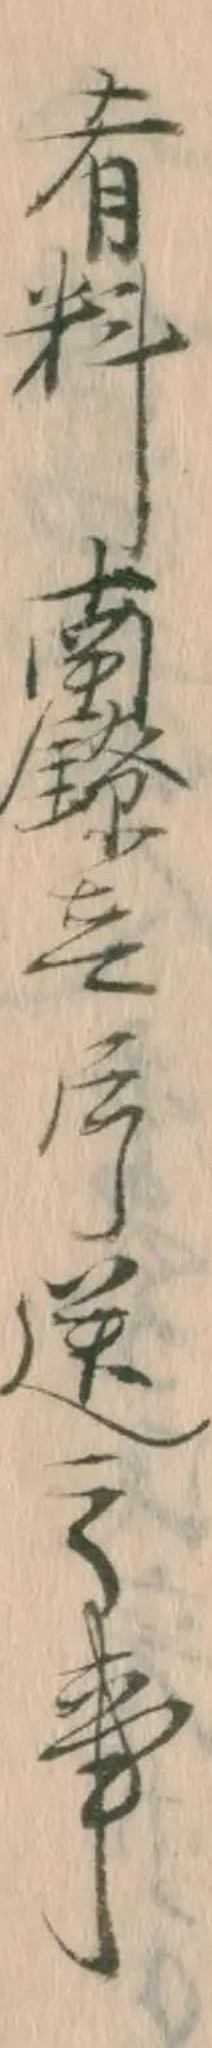肴料南鐐壱片送之事
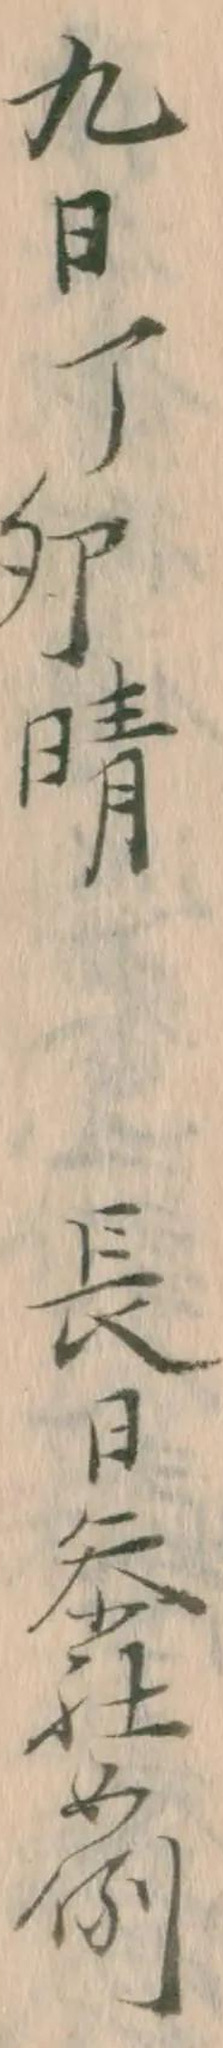九日丁卯晴長日参社如例
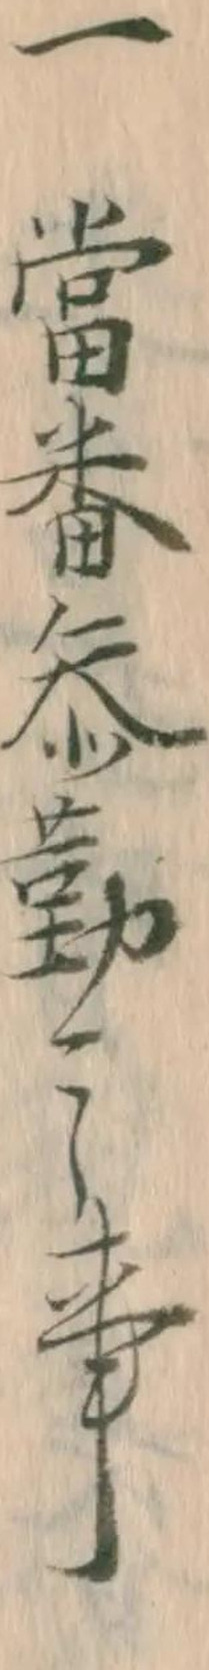一當番参勤之事
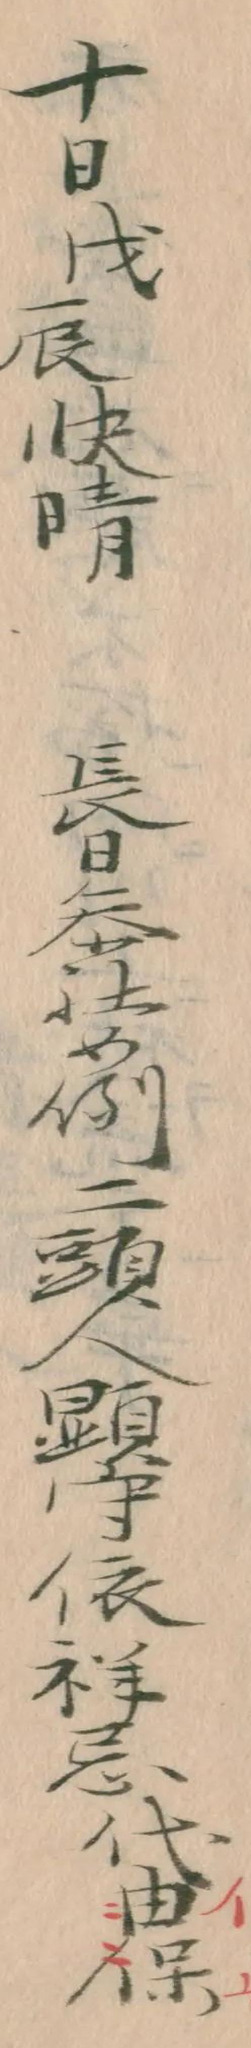十日戊辰快晴長日参社如例二頭人顕守依祥忌代由保
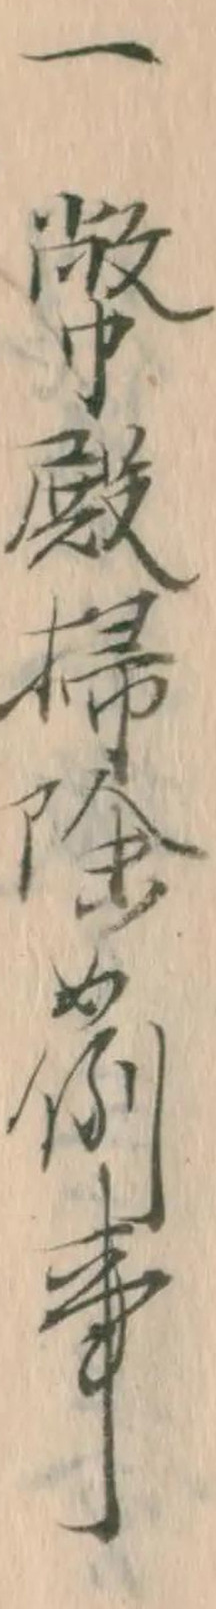一幣殿掃除如例事
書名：賀茂社記録. 第74冊
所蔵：国立国会図書館 National Diet Library, JAPAN
